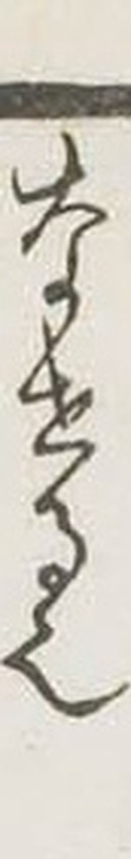なせる也
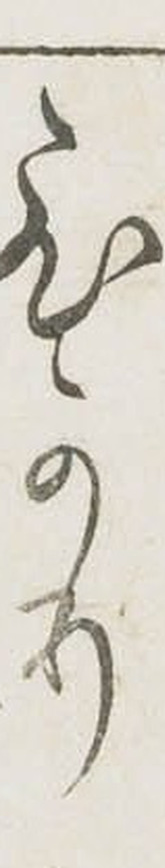ひかり
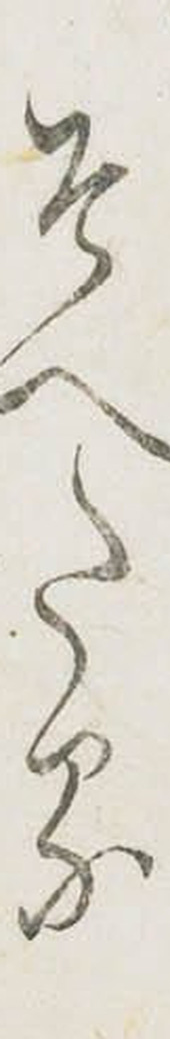そへたる
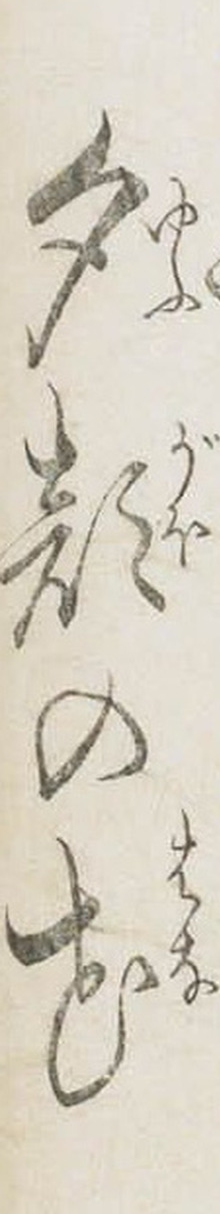夕顔の花
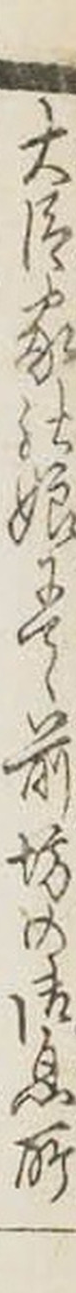大臣家の娘にて前坊の御息所
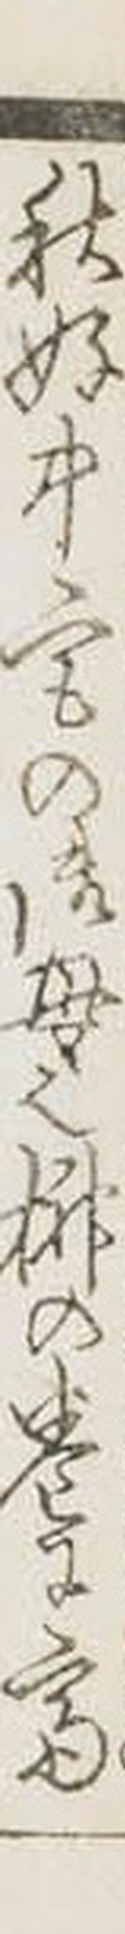秋好中宮の御母也榊の巻に斎
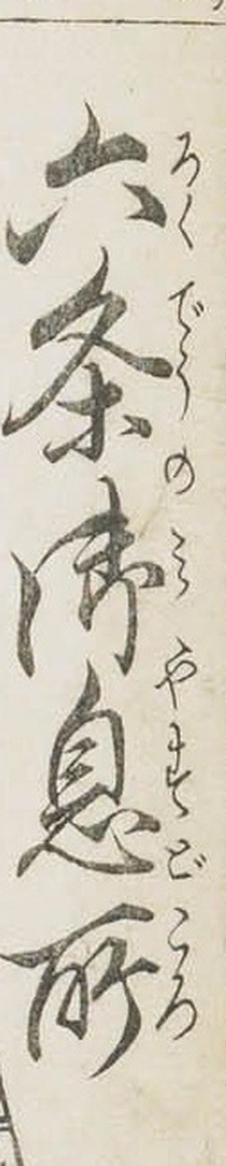六条御息所
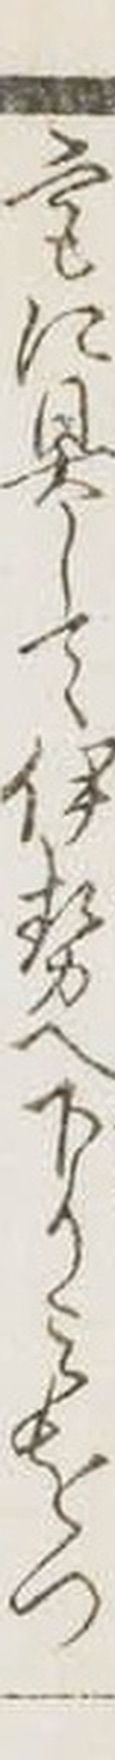宮に具して伊勢へ下りみをつ
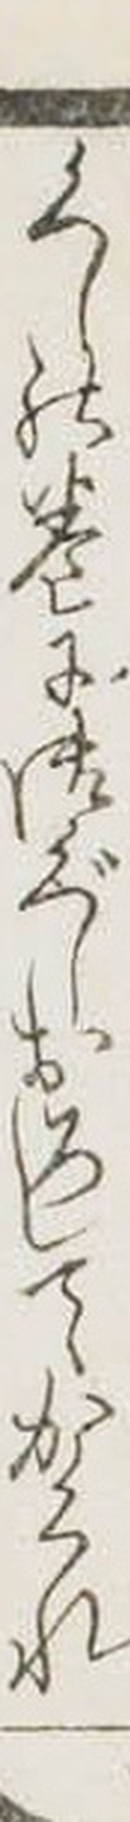くしの巻に御ぐしおろしてかくれ
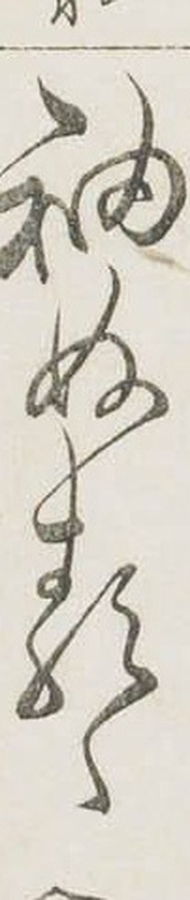袖ぬるゝ
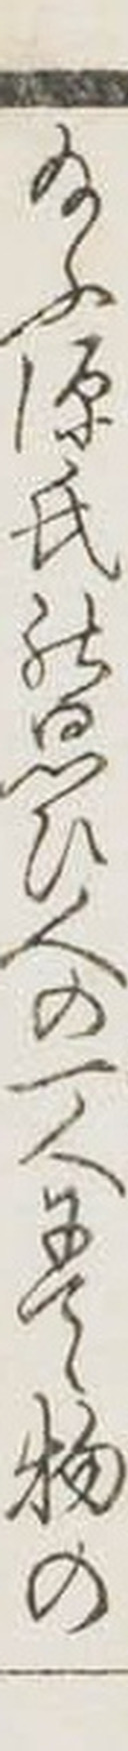給ふ源氏の思ひ人の一人にて物の
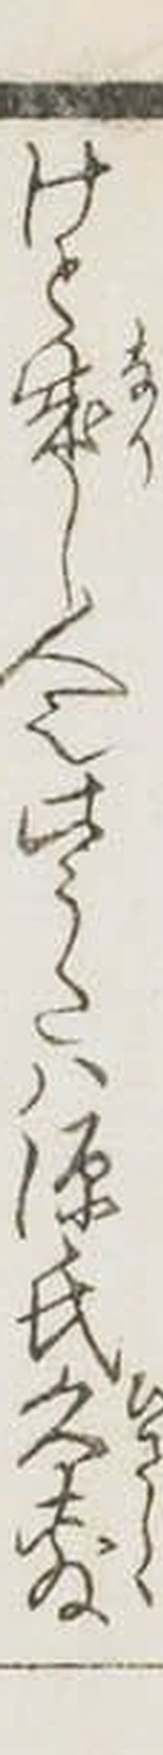けと成し人也此うたは源氏久敷
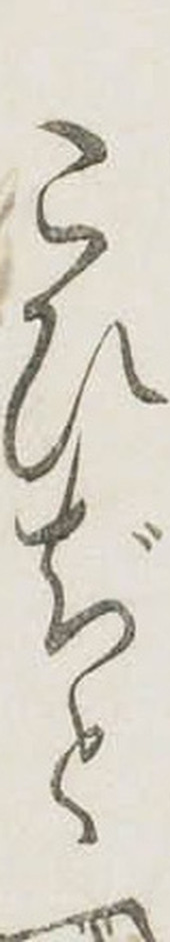こひぢと
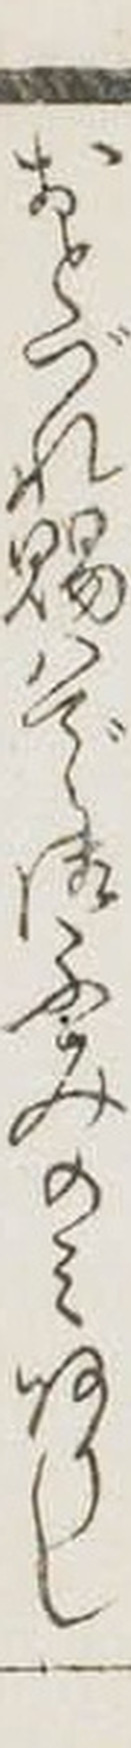おとづれ賜はで御ふみのみありし
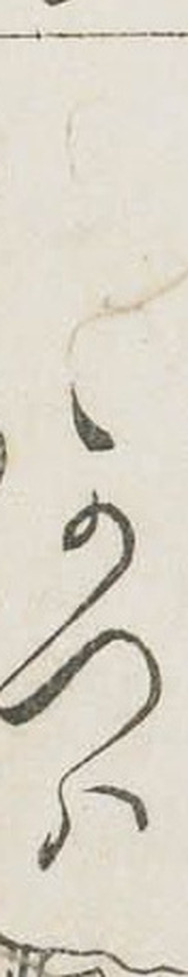かつは
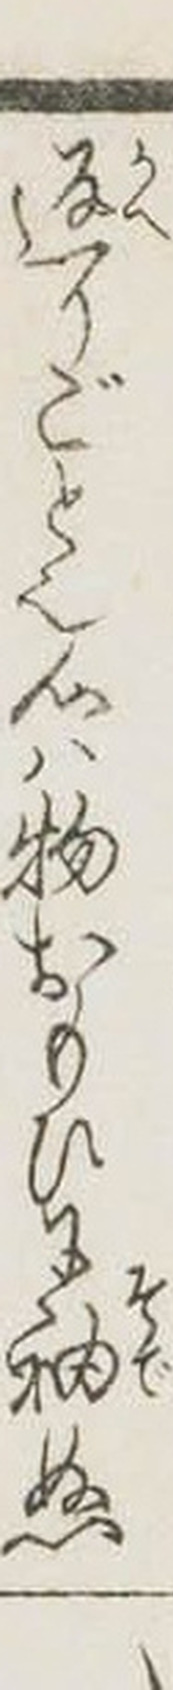返りごと也心は物おもひに袖ぬ
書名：源氏百人一首
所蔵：東京学芸大学教育コンテンツアーカイブ
